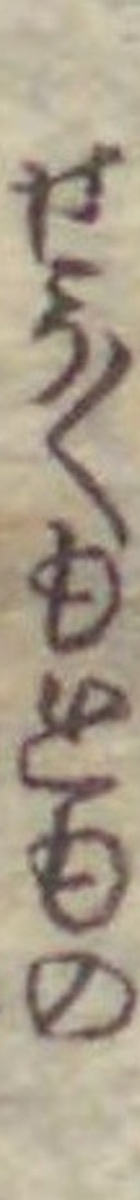せう〳〵もともの
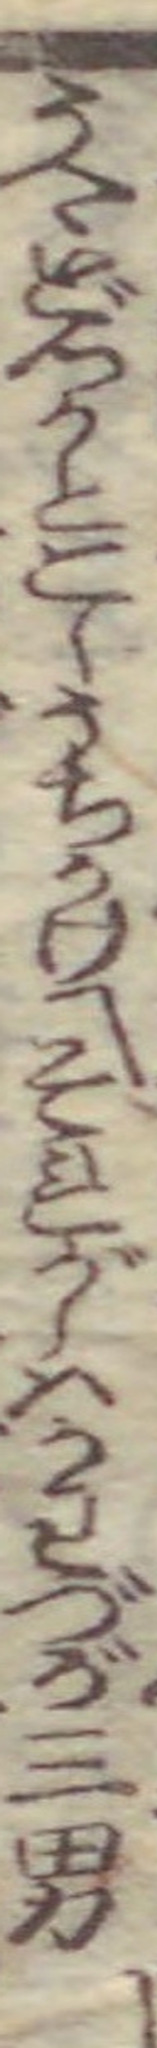うへゝどつかとこしうちかけ〽それがしはうわづが三男
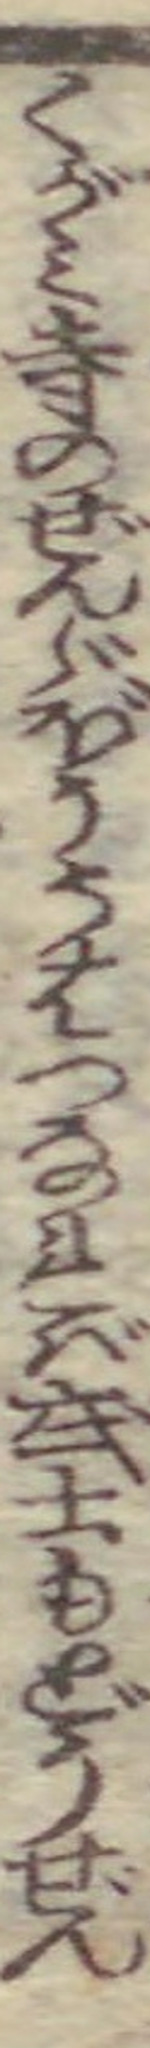くがみ寺のぜんじぼううはつななれば武士もどうぜん
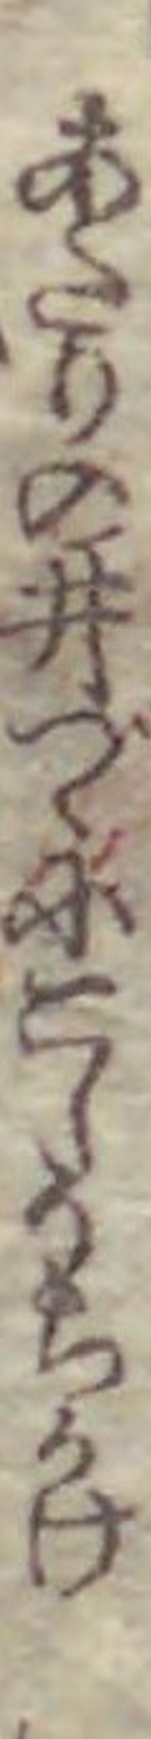あたりの井づゝにこしうちうちかけ
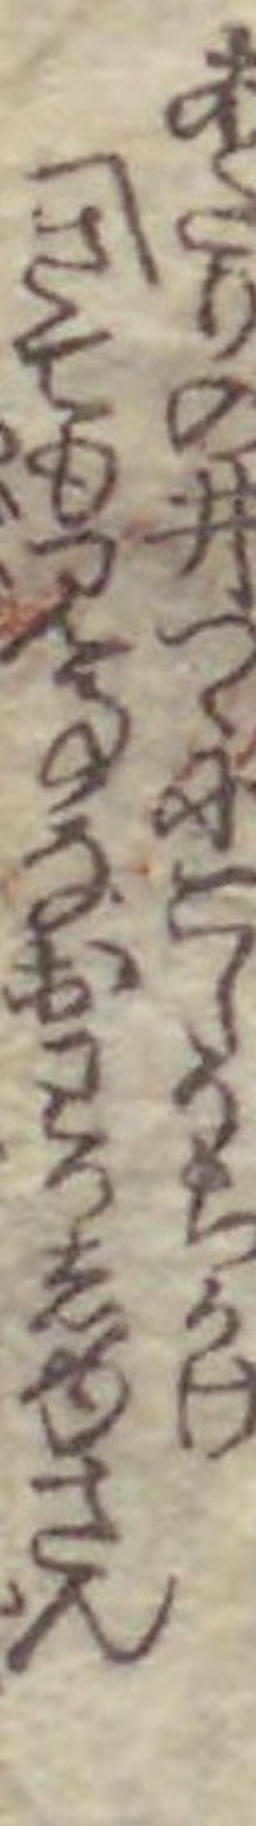〽さても見事なおわかしゆさん
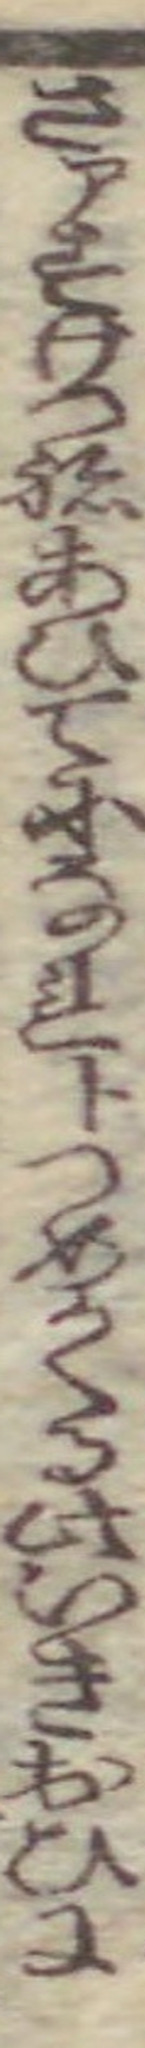さアすけつねあひてになれとつめかくる此いきおひに
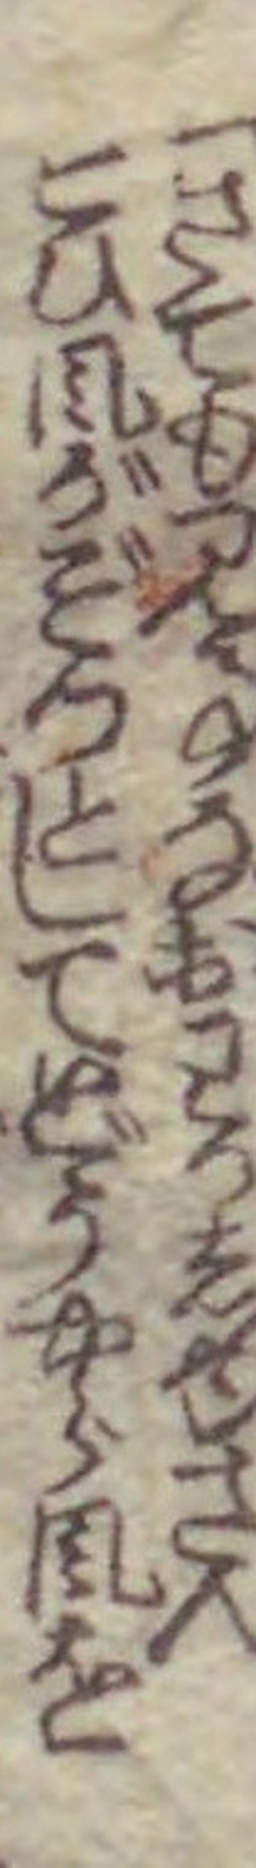こひ風がぞつとしてどうやら風を
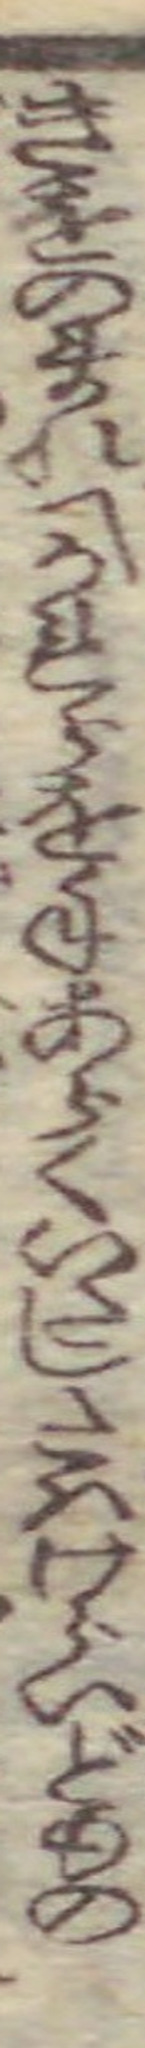きをのまれ〽かれらを手あらくいたしたはけらいどもの
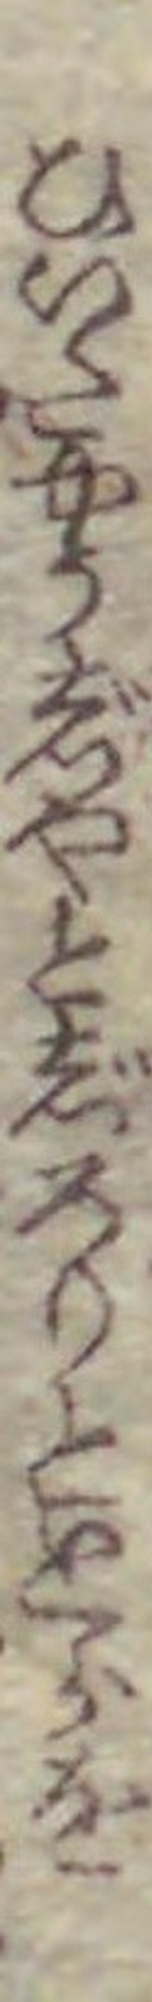ひいたやうじやとじろりととらを
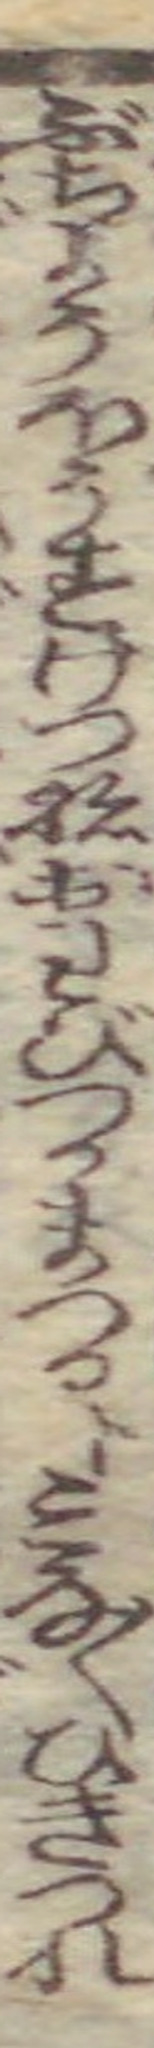ぶちようほうすけつねおわびつかまつるとみな〳〵ひきつれ
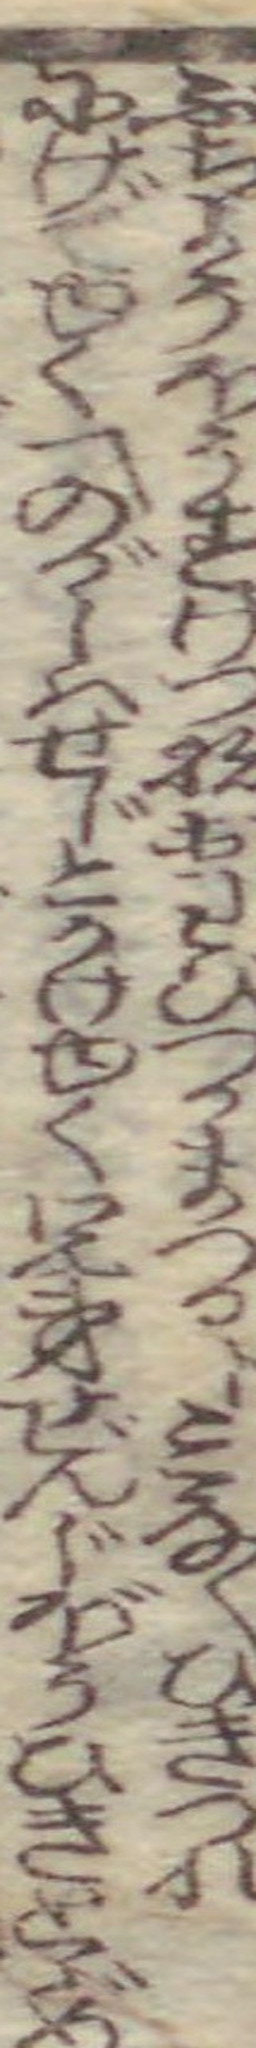にげてゆく〽のがしはせじとかけゆく兄弟ぜんじぼうひきとゞめ
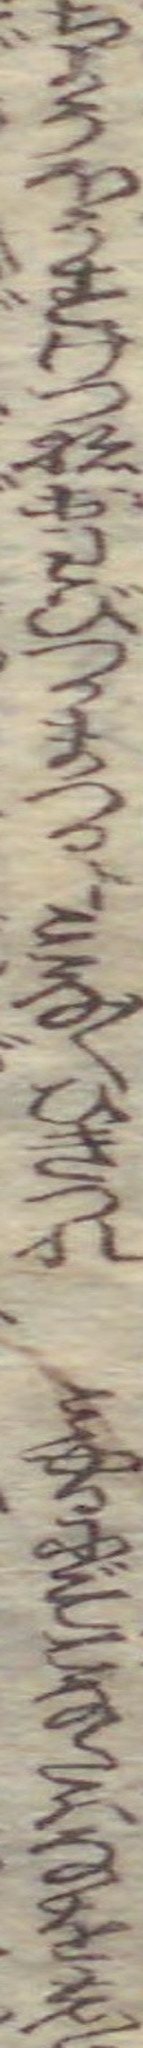ぶちようほうすけつねおわびつかまつるとみな〳〵ひきつれ
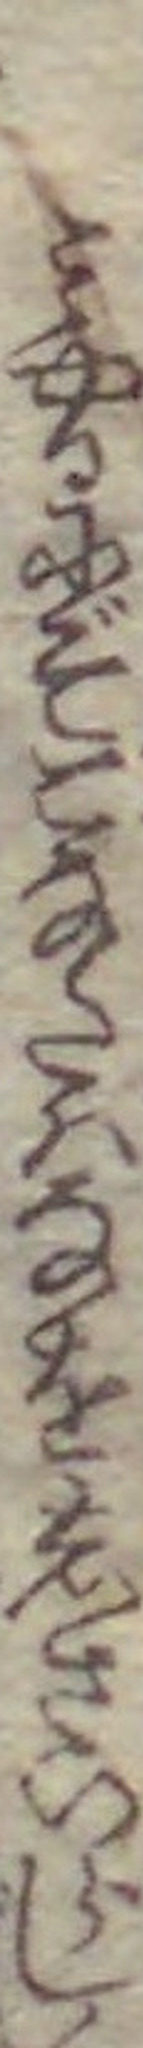みやるにぞこなたはなをしさいらしく
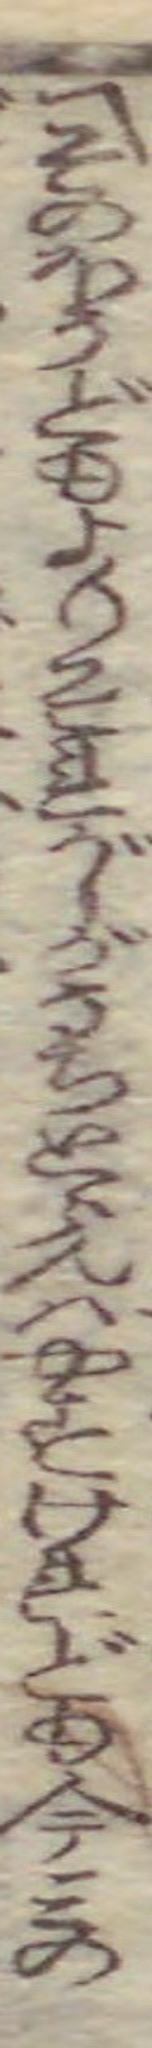〽そのほうどもよりそれがしがうちとらんはやすけれども今みの
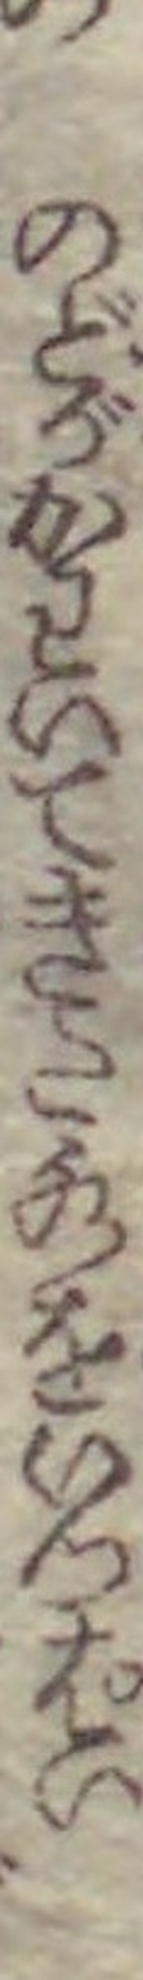のどがかわいてきた水をいつぱい
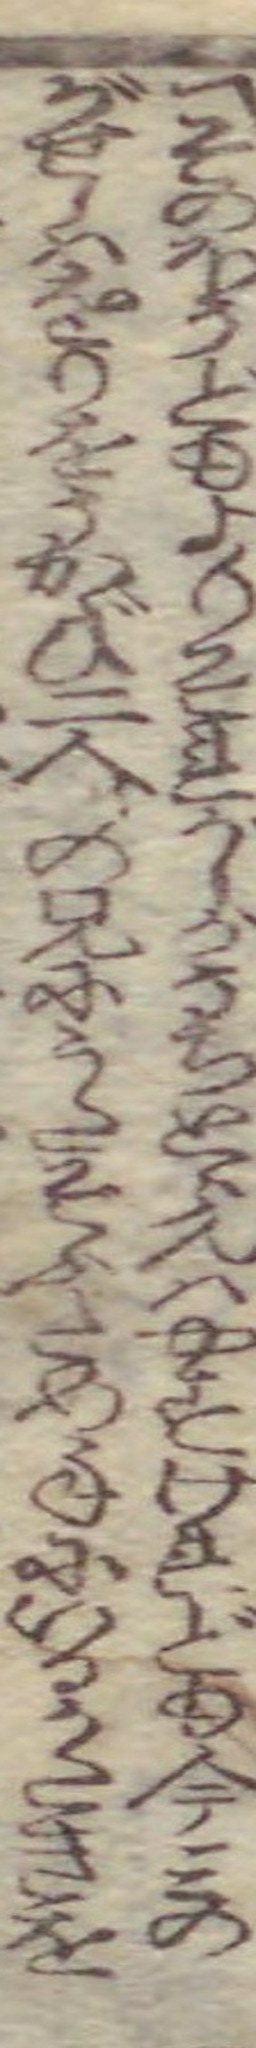がせしはをりをうかゞひ二人りの兄にうたそふため手にいるかたきを
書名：大時代唐土化物 3巻. 曽我太夫染
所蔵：国立国会図書館 National Diet Library, JAPAN
